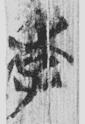季
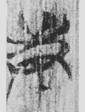庚（康）
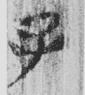子
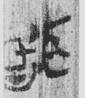䎽（問）
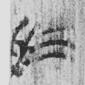於
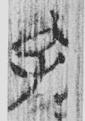孔子
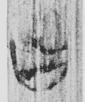曰
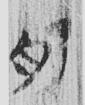肥
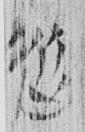從
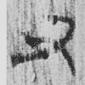又（有）
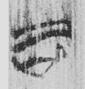司
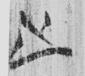之
